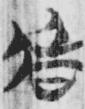俈
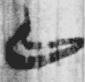㠯（以）
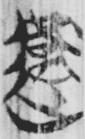躛
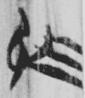於
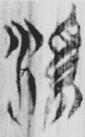溪
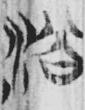浴（谷）
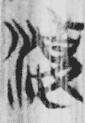淒（濟）
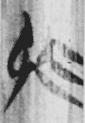於
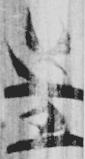○（廣）
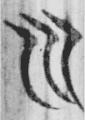川
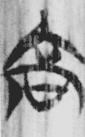高
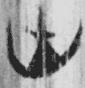山
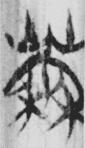蓁
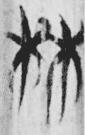林
